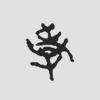事
